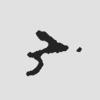亓（其）
